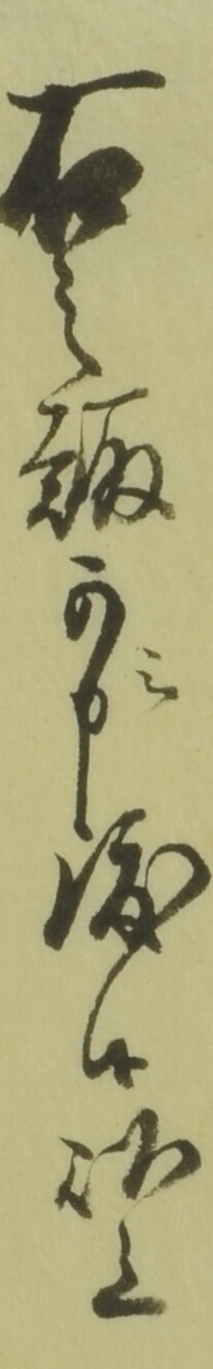右之趣可被申渡候以上
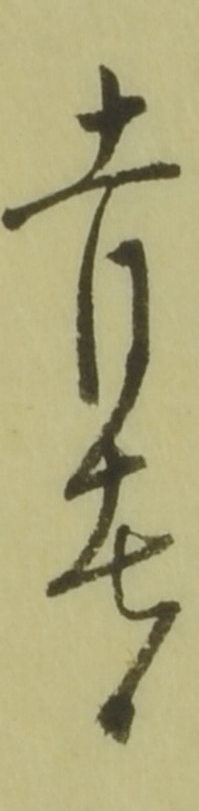十一月十七日
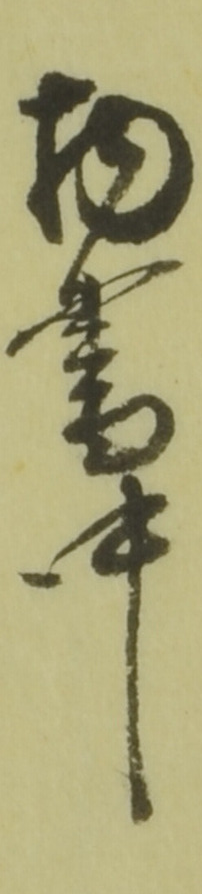物書中
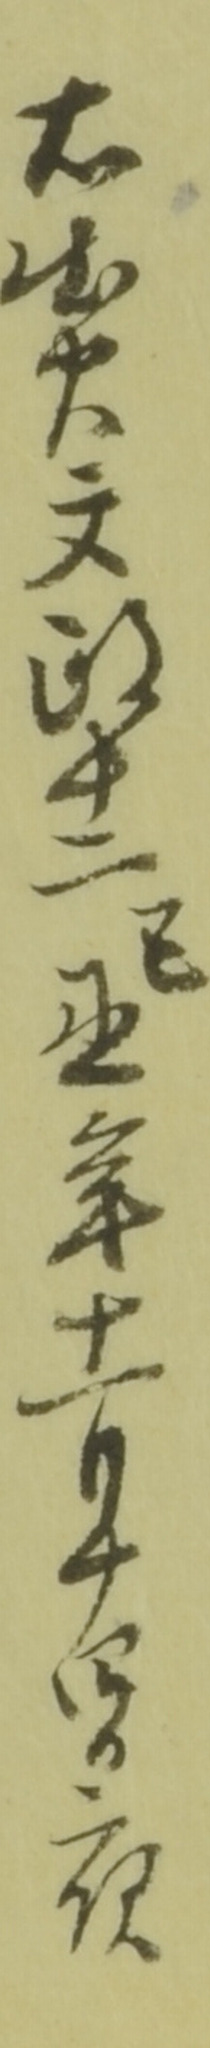右出火文政十二己丑年十一月十四日夜

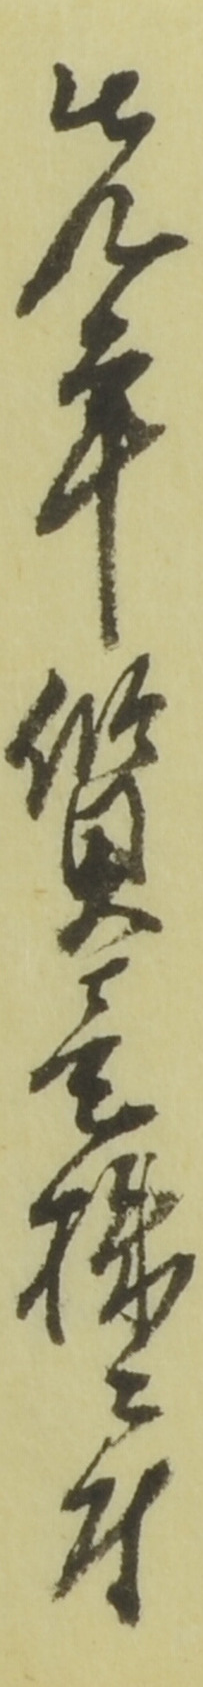先年質屋株ニ付
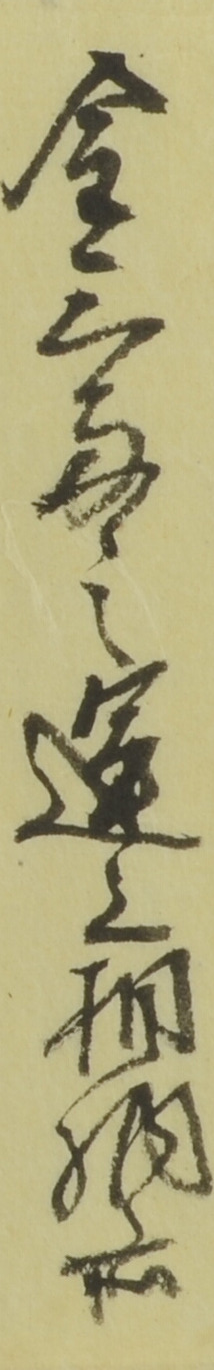金三両之運上相納候所
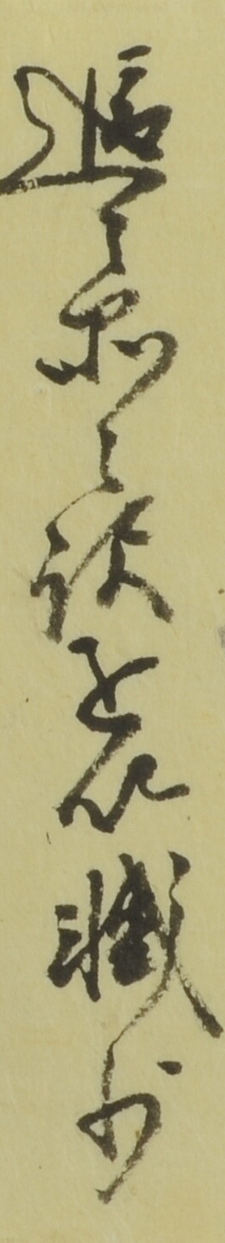追々品々訳を以減少
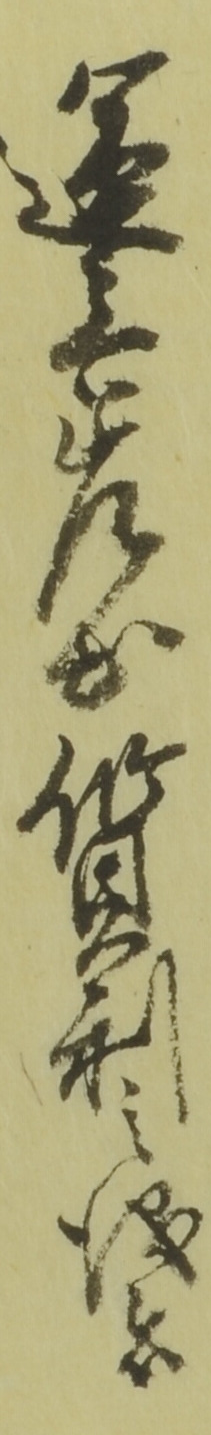運上差出質利之儀は
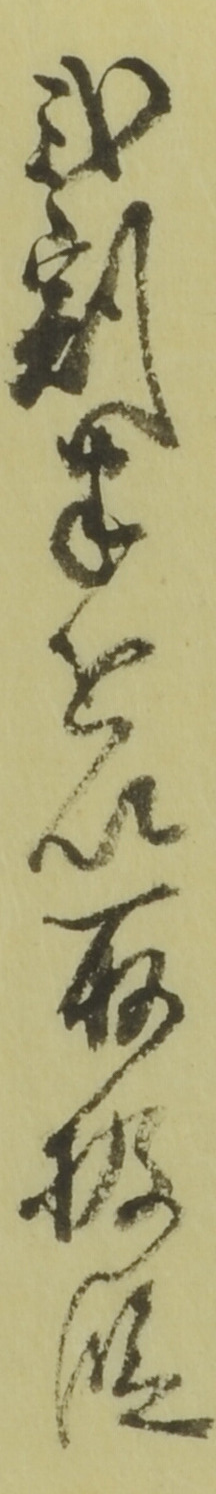弐割半を以取扱段
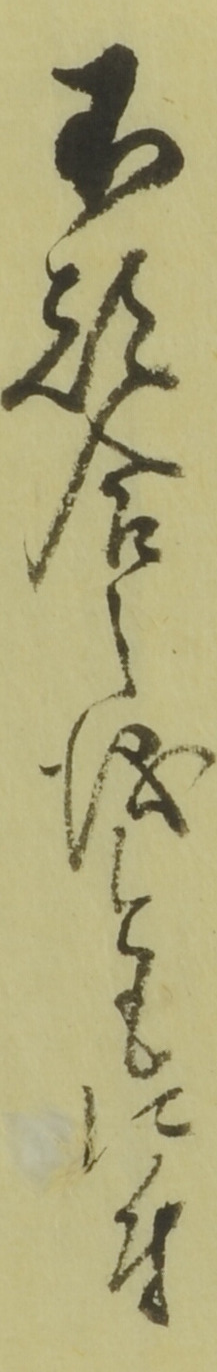不都合之儀ともに付
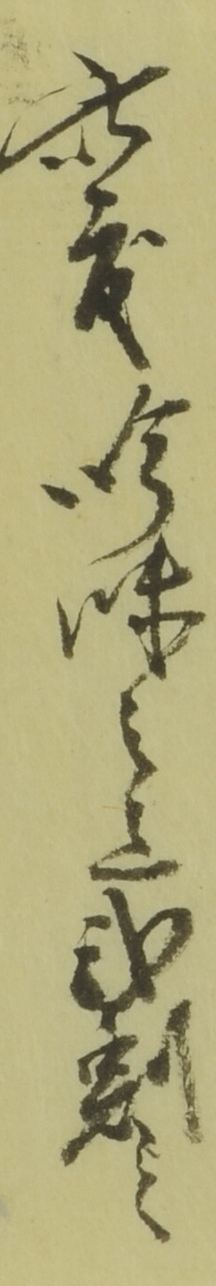此度吟味之上弐割之
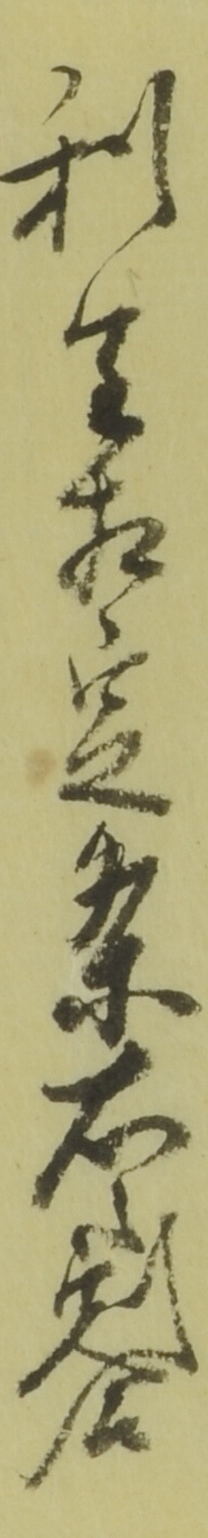利生相定条右之割合
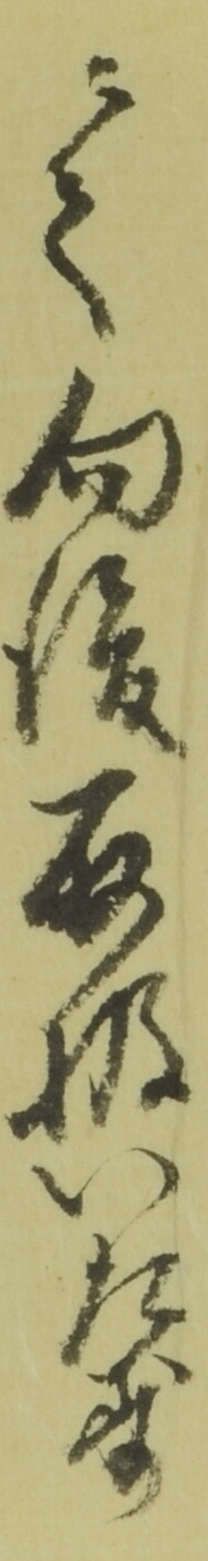ニて向後取扱いたす
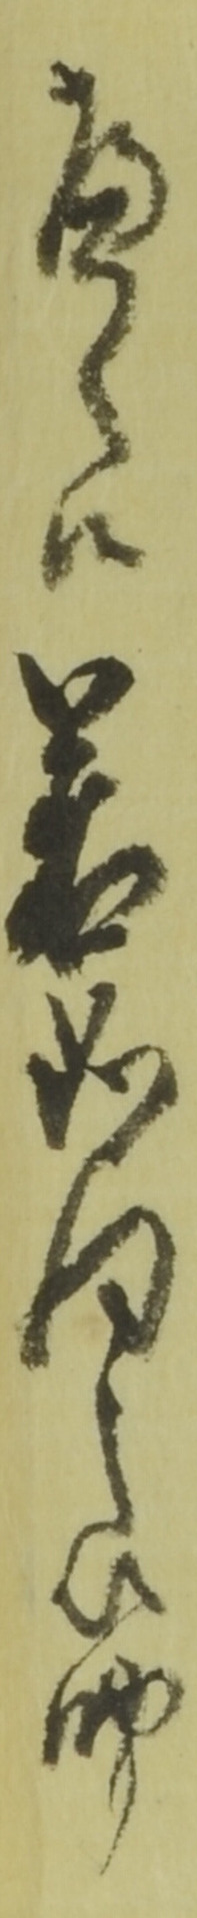へく候若如何之筋
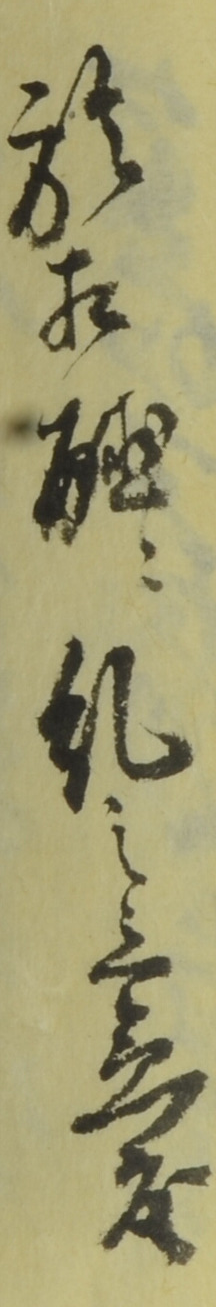御相聴ニ糺之上急度
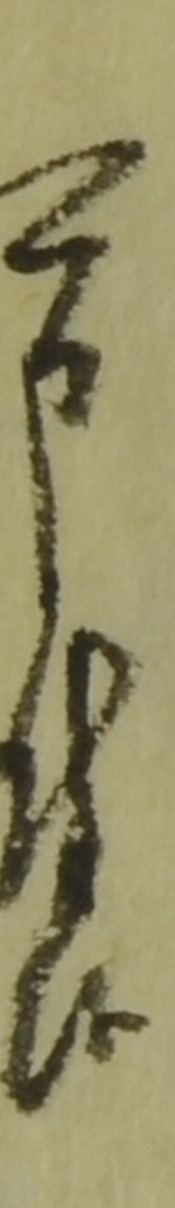可申付候
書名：御触書御書附控
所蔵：伊那市立高遠町図書館・合同会社AMANE
